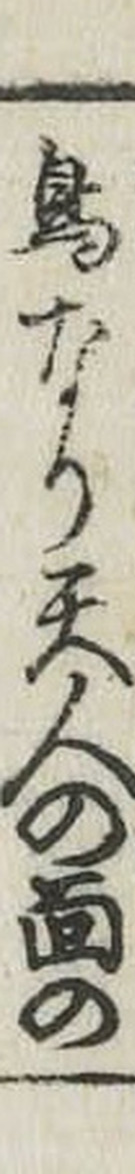鳥なり天人の面の
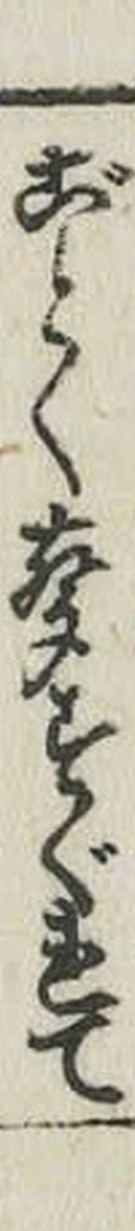ごとく声すぐれて
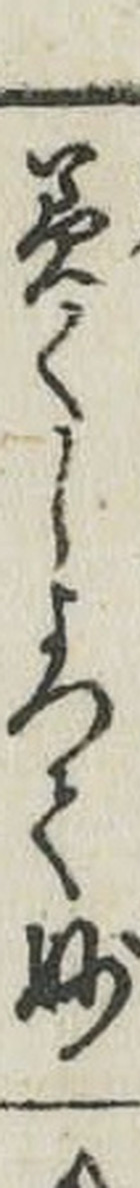美くしよつて妙
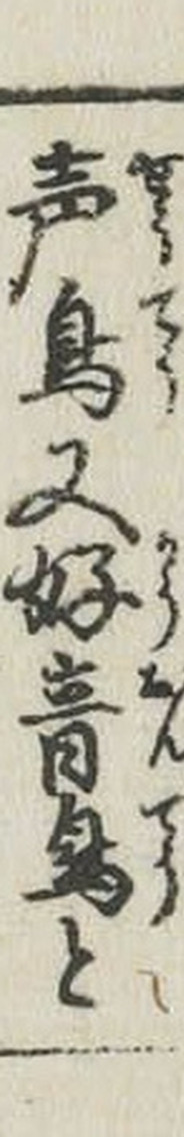声鳥又好音鳥と
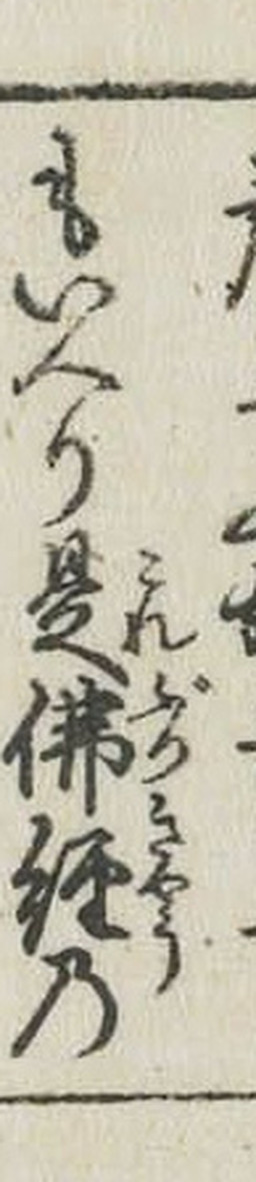もいへり是仏教の
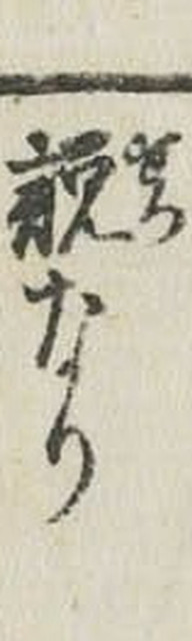説なり
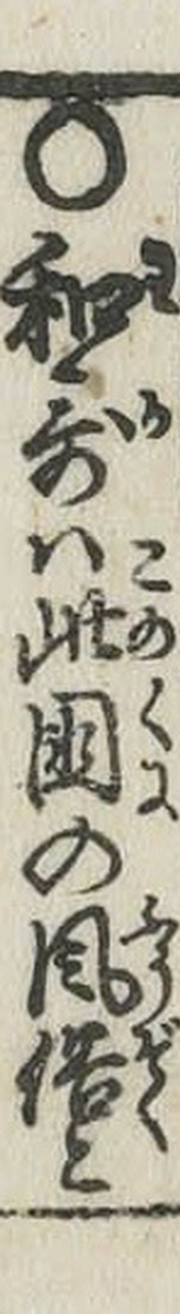○和哥は此国の風俗と
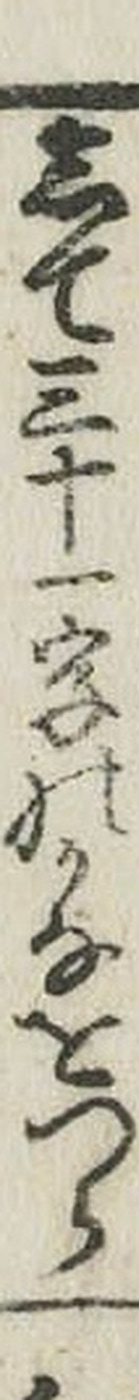して三十一字のかなをつら
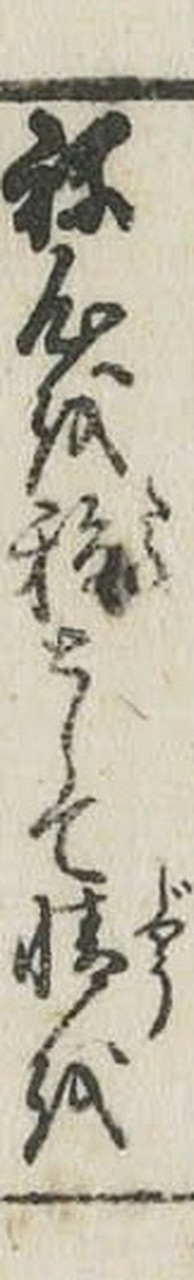ね心を種として情を
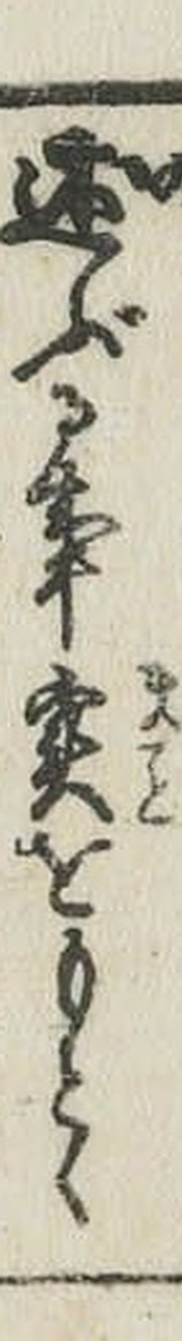述ぶる事実をもとゝ
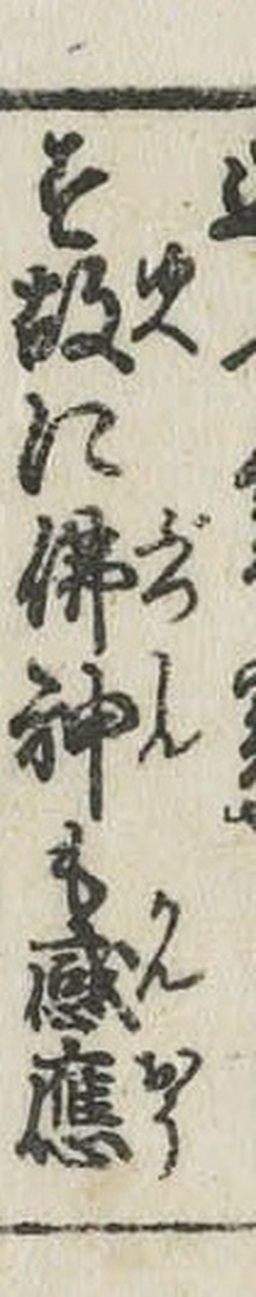す故に仏神も感応
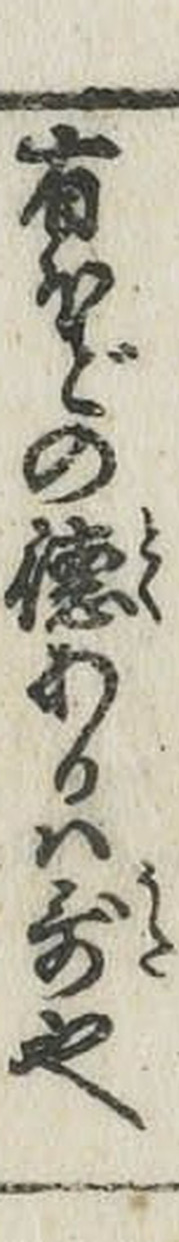有ほどの徳あるは哥也
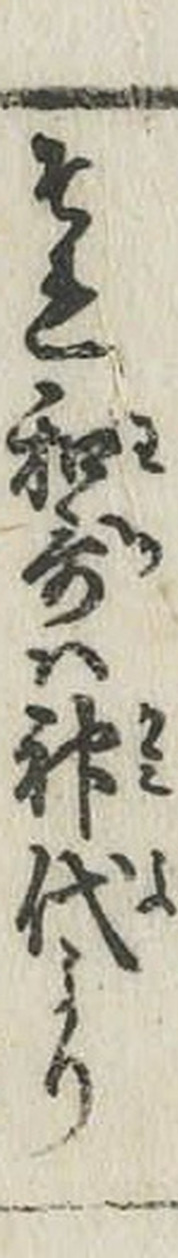それ和哥は神代より
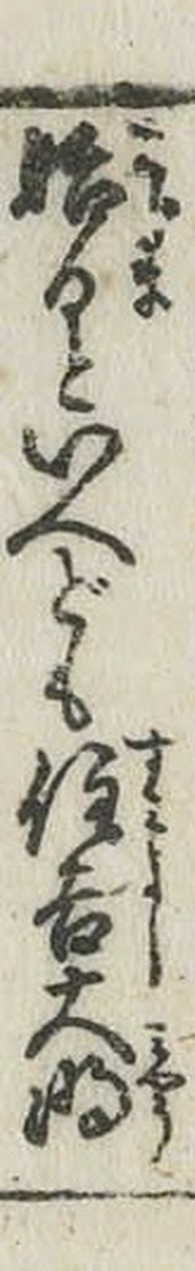始るといへども住吉大明
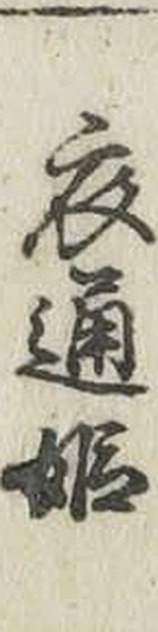衣通姫
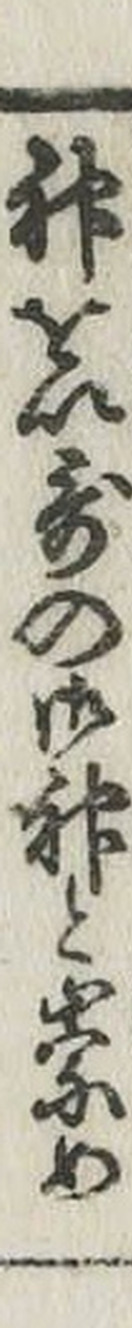神を以哥の御神と崇め
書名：増補頭書訓蒙図彙大成 10巻 10:巻之21
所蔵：東京学芸大学教育コンテンツアーカイブ
